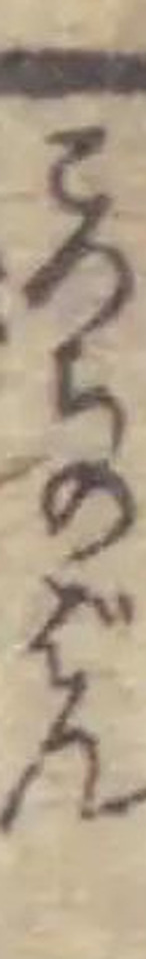こつちのばん
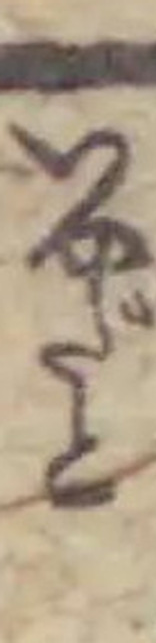いやだと
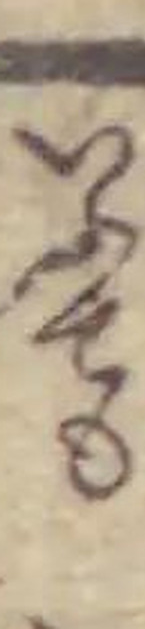いふても
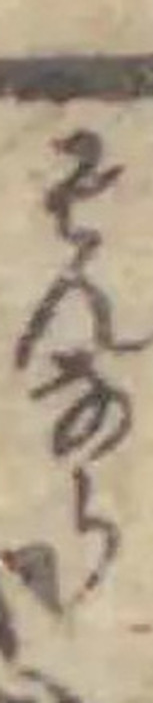そんなら
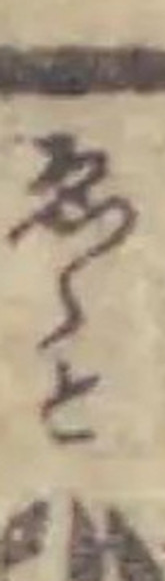ゑゝと
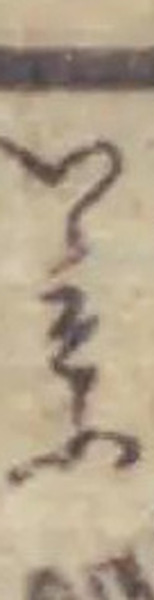いゝそふ
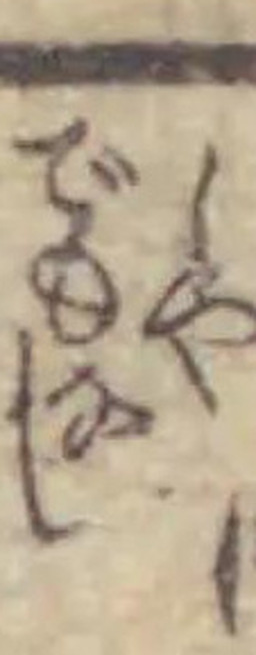でもなし
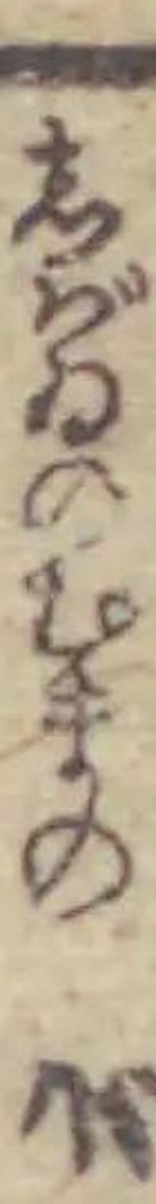しばゐのむまの
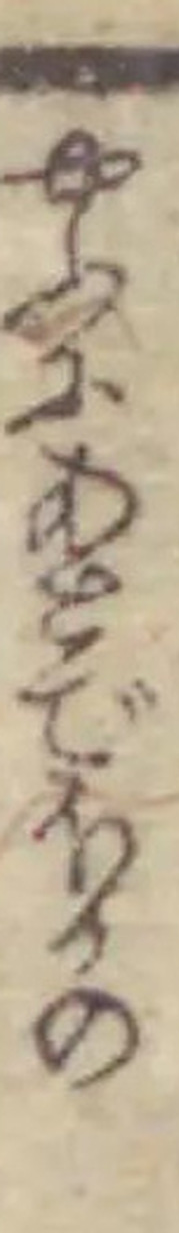やふにあとでほかの
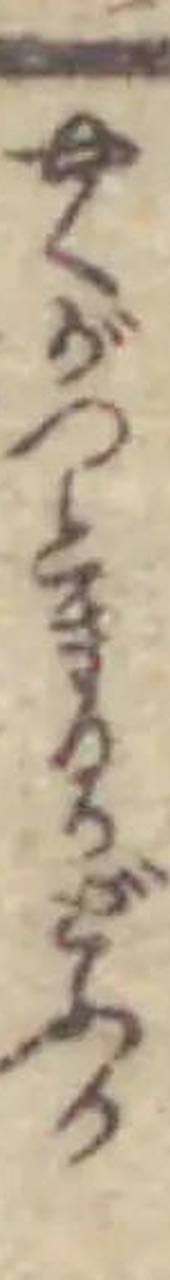やくがつとまるかどふか
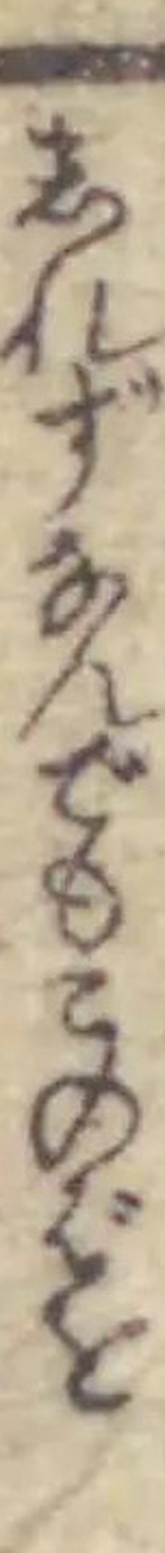しれずなんでもこのばを
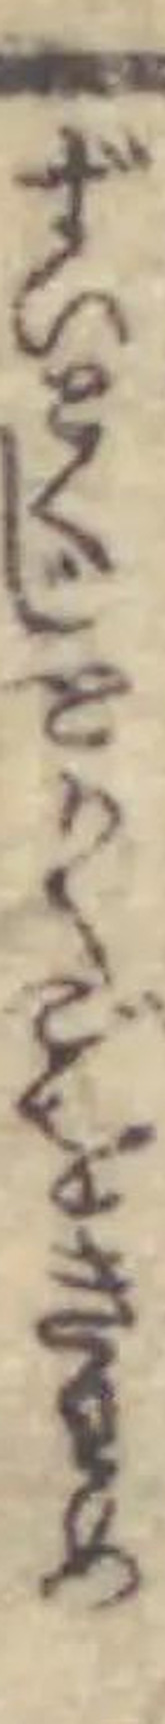随徳寺とかくごをきわめ
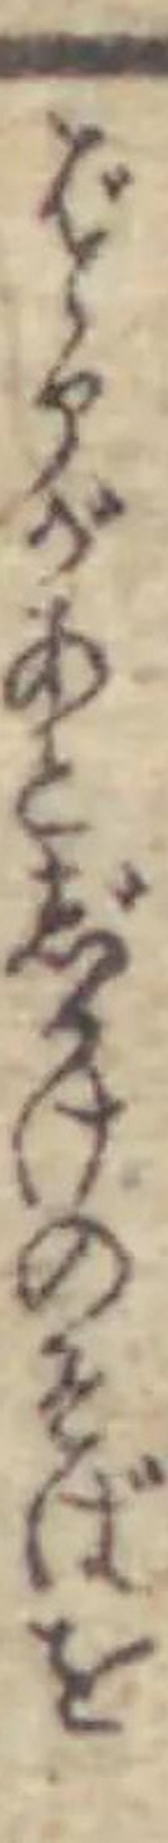ばゝアがあとじかけのそばを
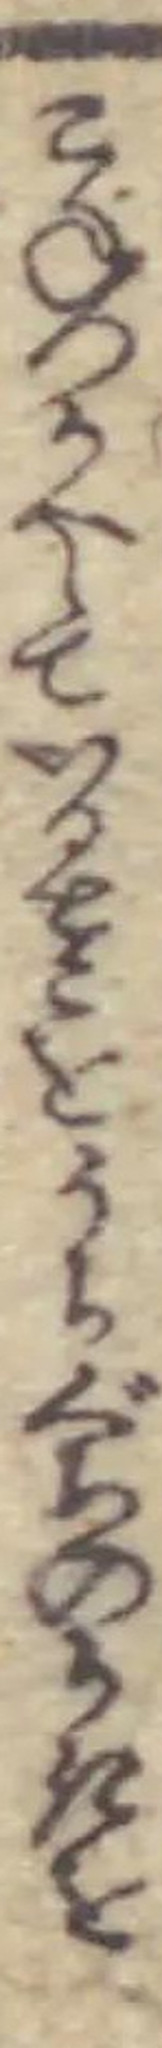こねつかへしているとこをうらぐちのかきを
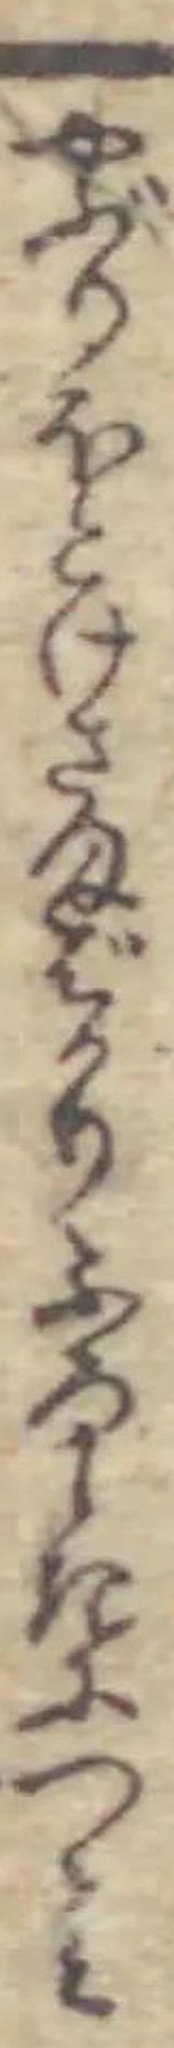やぶりほとけさまばかりふろしきにつゝみ
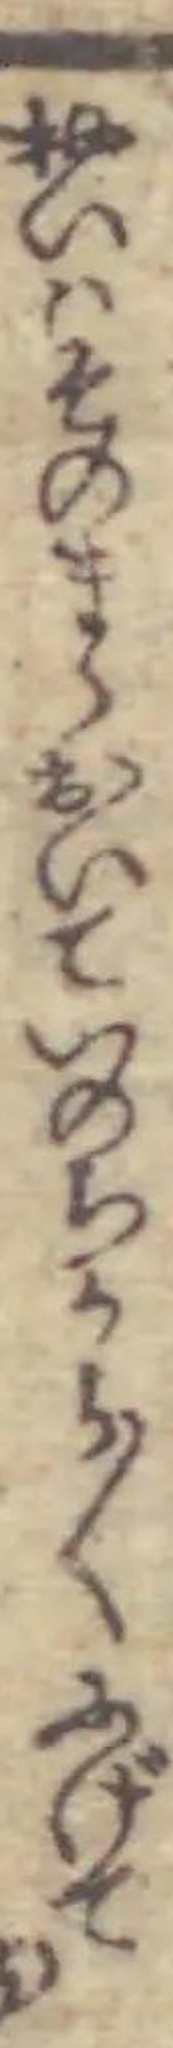おいはそのまゝおいていのちから〳〵にげて
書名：もふもふもふ怖噺 2巻
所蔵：国立国会図書館 National Diet Library, JAPAN
